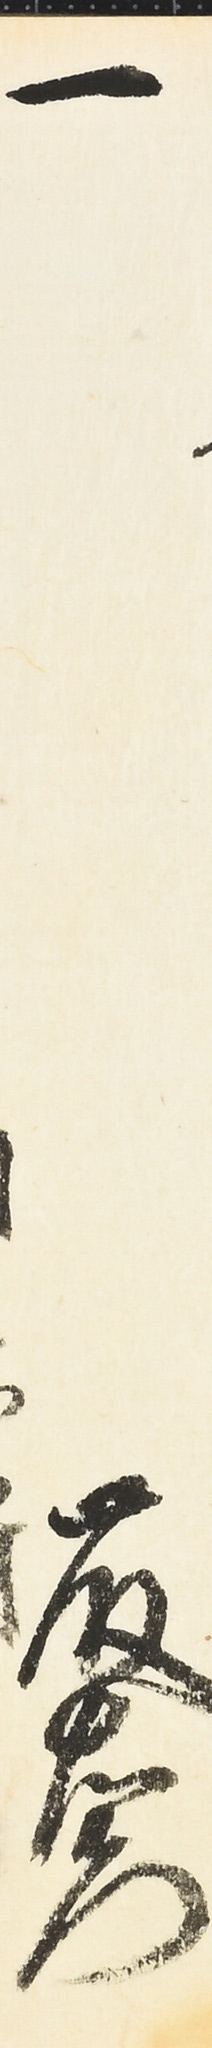一籐右衛門
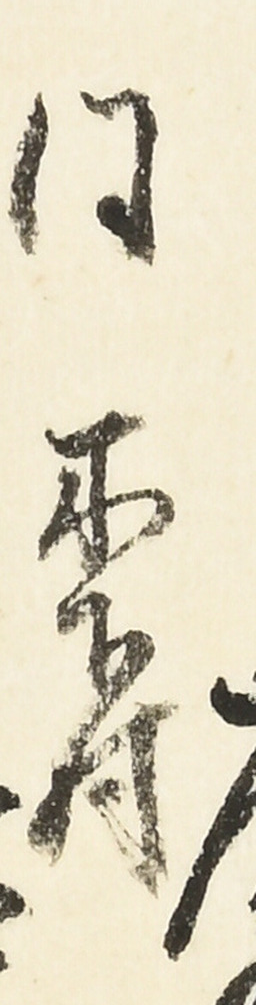同木下村
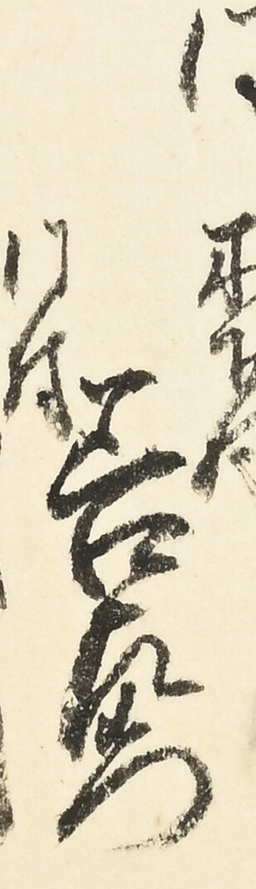善左衛門
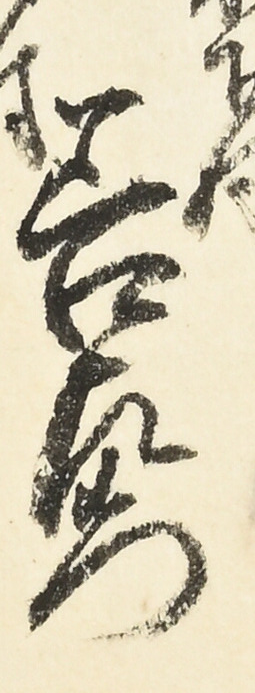善左衛門
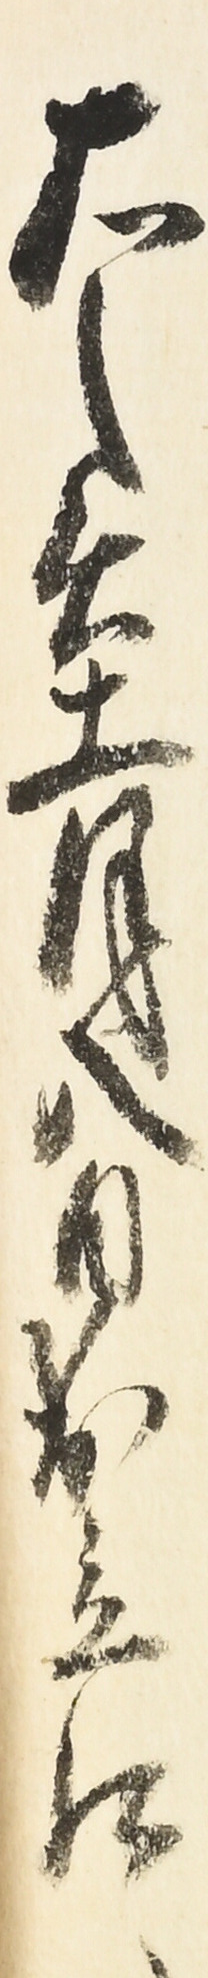右之者十一月八日出立仕候
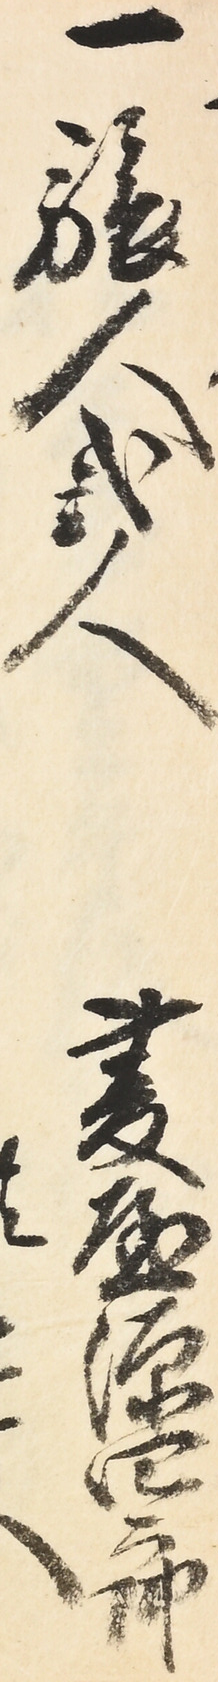一旅人壱人扇屋半四郎
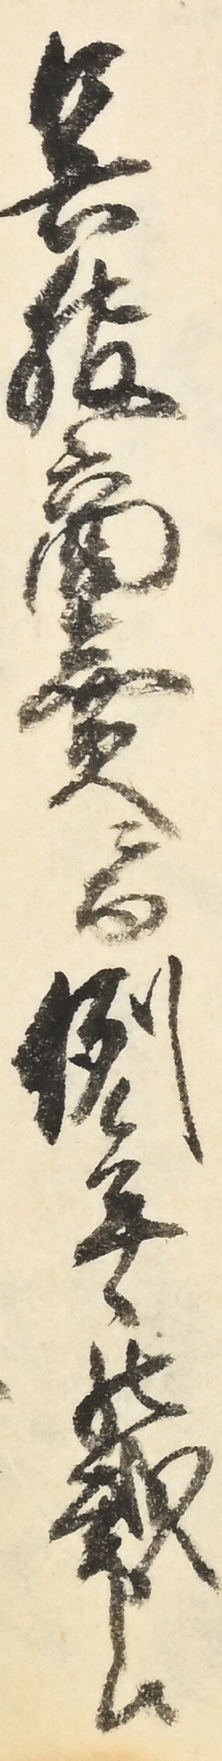薬種商売ニ而例年罷越申候

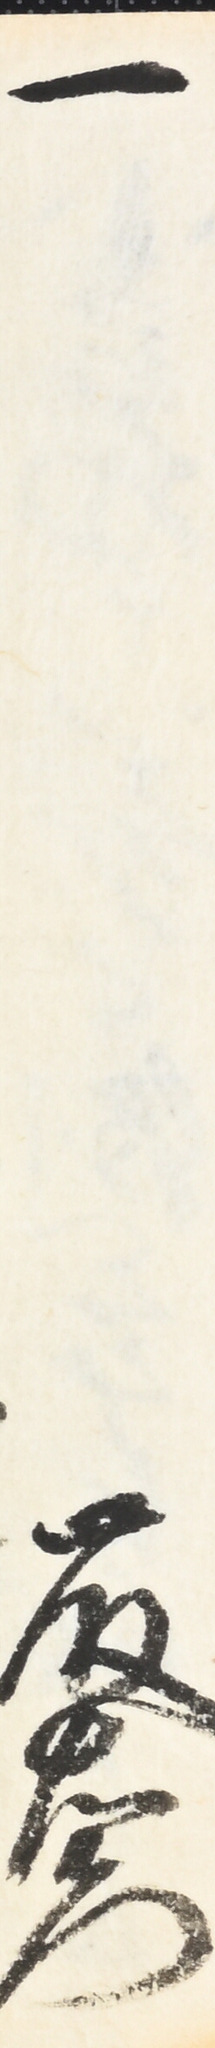宿金右衛門
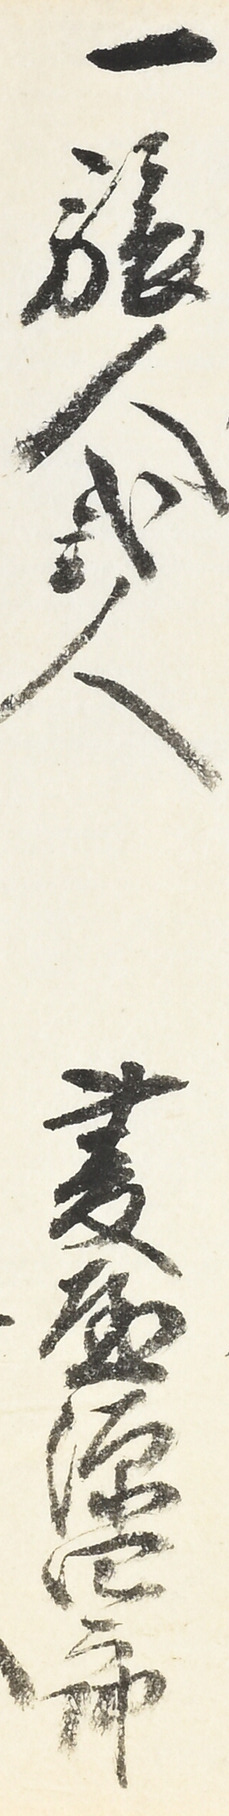一旅人弐人菱屋源四郎
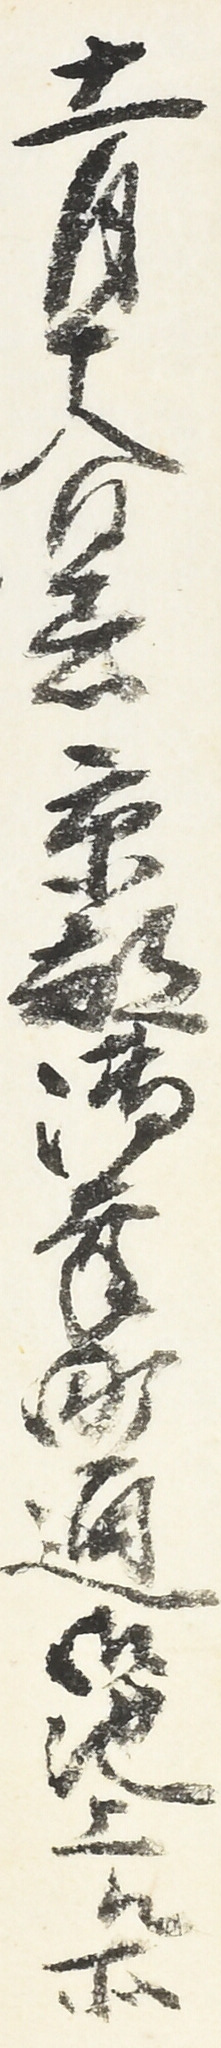十一月十八日着京都御幸町通御池上ル所
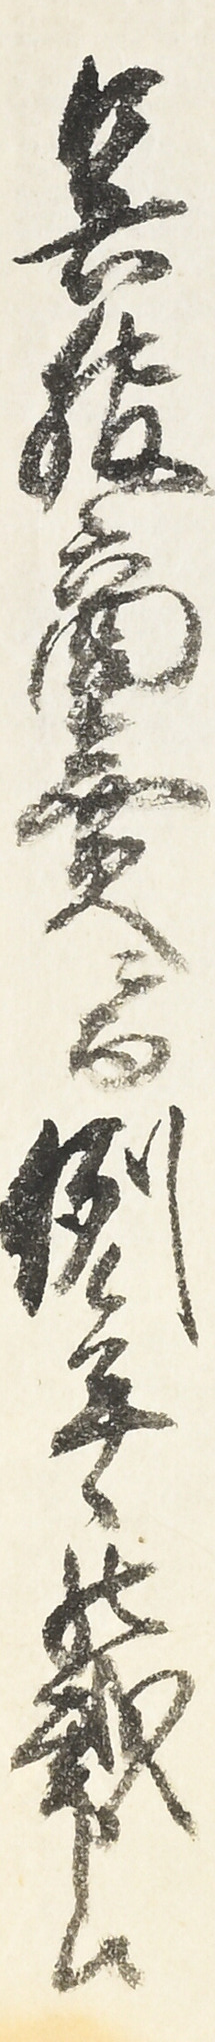呉服商売ニ而例年罷越申候
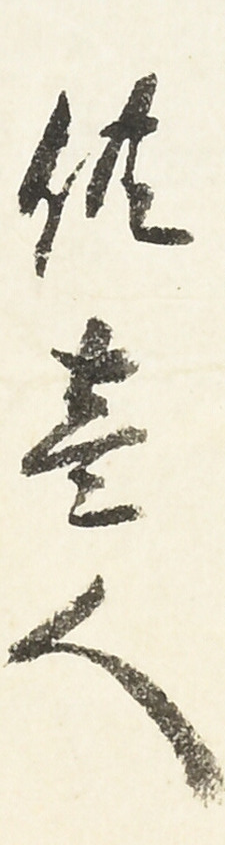供壱人
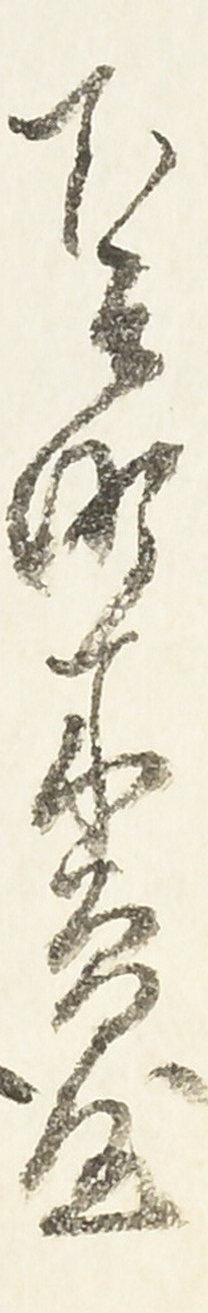下モ町木曽屋
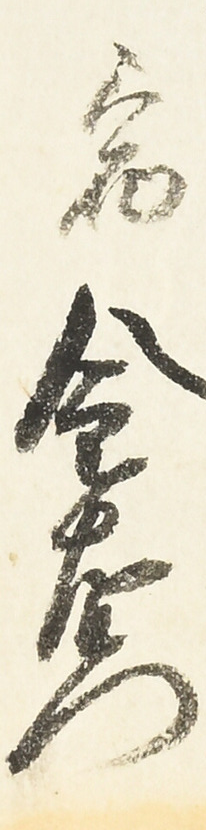宿金右衛門
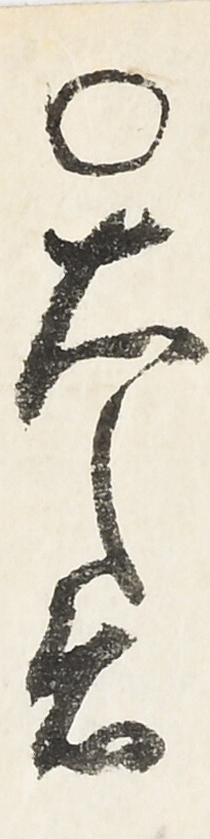〇右之者
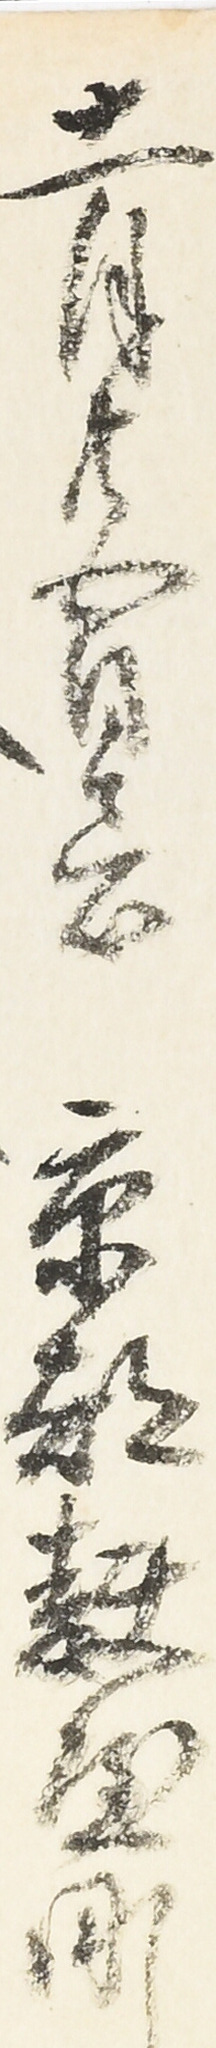十一月廿五日着京都麩屋町
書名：町中旅人泊控帳
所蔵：伊那市立高遠町図書館・合同会社AMANE
